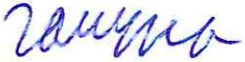гаичка
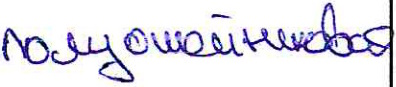полуошейниковая
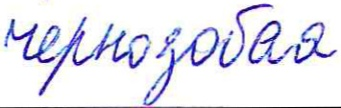чернозобая
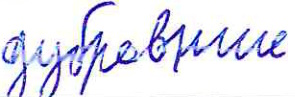дубровник
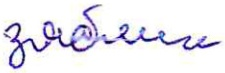зяблик
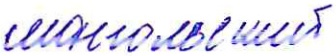монгольский
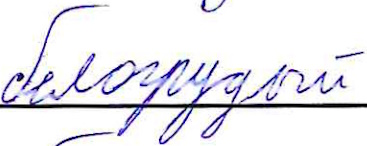белогрудый
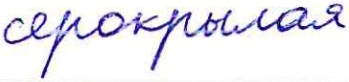серокрылая
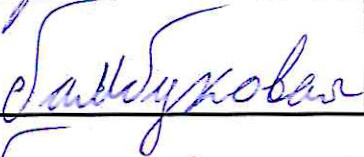бамбуковая
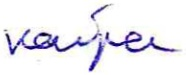кайра
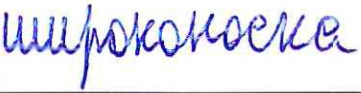широконоска
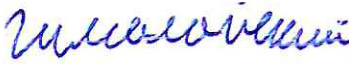гималайский
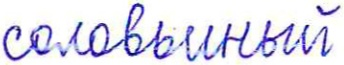соловьиный
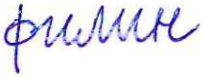филин
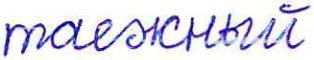таежный
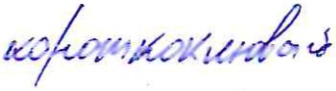короткоклювый
